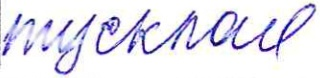тусклая
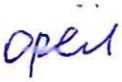орёл
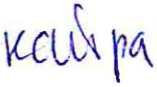кайра
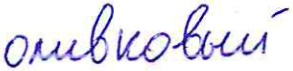оливковый
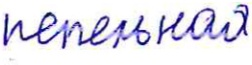пепельная
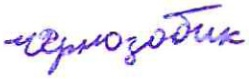чернозобик
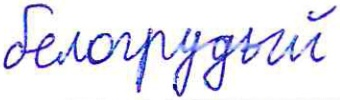белогрудый
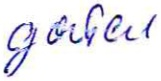дятел
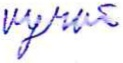кумай
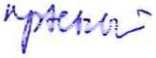крэсный
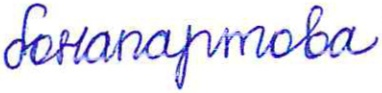бонапартова
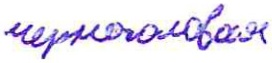черноголовая
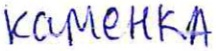каменка
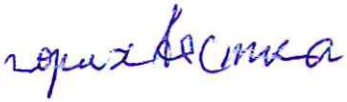горихвостка
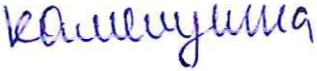каменушка
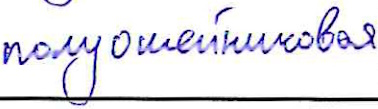полуошейниковая
